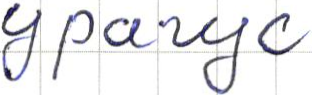урагус
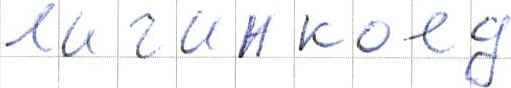личинкоед
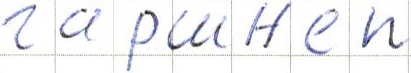гаршнеп
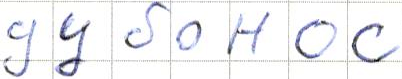дубонос
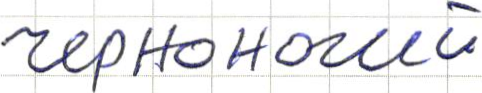черноногий
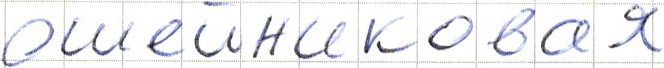ошейниковая
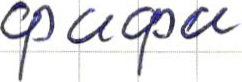фифи
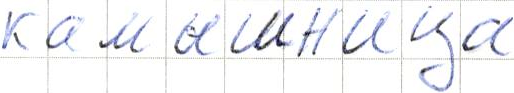камышница
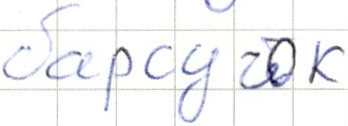барсучок
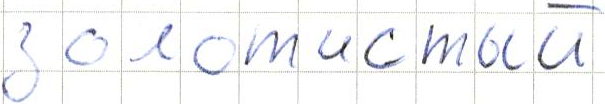золотистый
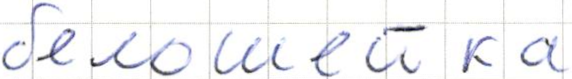белошейка
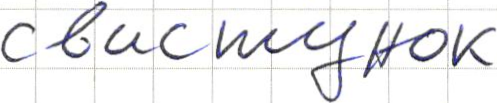свистунок
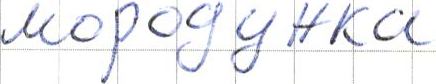мородунка
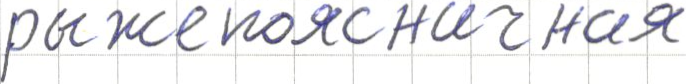рыжепоясничная
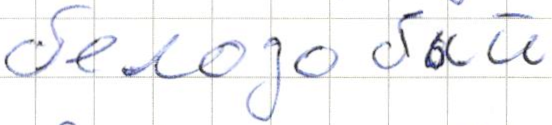белозобый
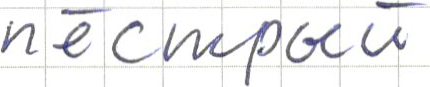пёстрый
